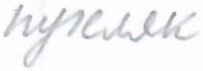пухляк
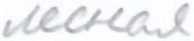лесная
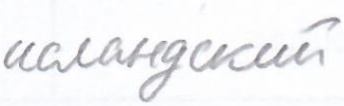исландский
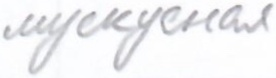мускусная
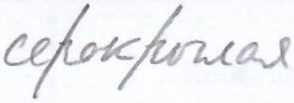серокрылая
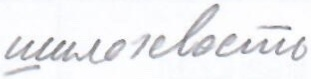шилохвость
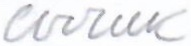сычик
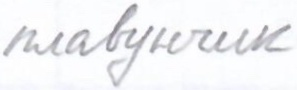плавунчик
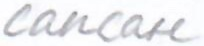сапсан
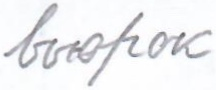вьюрок
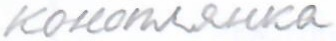коноплянка
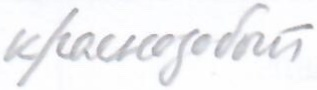краснозобый
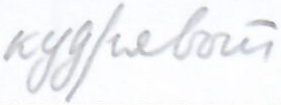кудрявый
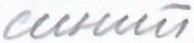синий
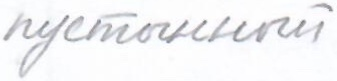пустынный
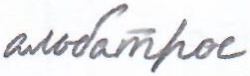альбатрос
